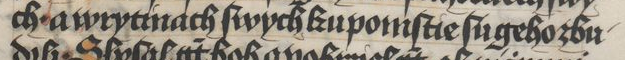ch.a wrytinach ſwych kuponiſtie ſu geho zbu¬
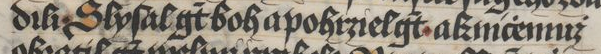dili.Slyſal ḡt boh a pohrziel ḡt.a kniċemuż
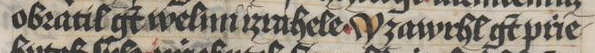obratil ḡt welmi izrahele.Y zawrhl ḡt pṙie¬
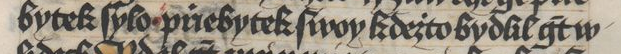bytek ſylo.pṙiebytek ſwoy kdeżto bydlil ḡt w¬
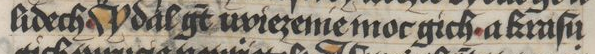lidech.Y dal ḡt uviezenie moc gich.a kraſu
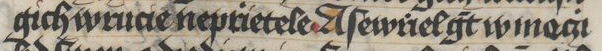gich wrucie nepṙietele.Aſewṙiel ḡt wmocżi
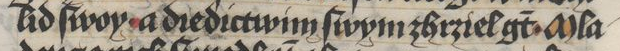lid ſwoy.a diedictwím ſwym zhrziel ḡt. Mla¬
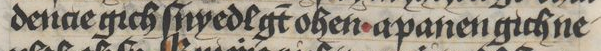dencie gich ſnyedl ḡt ohen.apanen gich ne¬
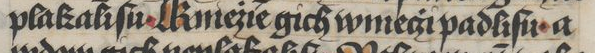plakali ſu.Knieżie gich wmecżi padliſu.a¬
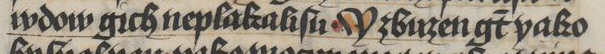wdow gich neplakaliſu.Y zbuzen ḡt yako
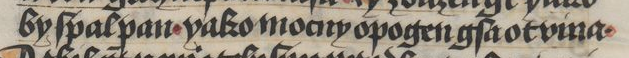by ſpal pan.yako mocny opogen gſa ot vina.
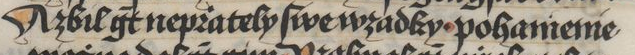Azbil ḡt nepṙately ſwe wzadky.pohanienie
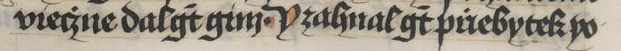viecżne dal ḡt gim.Yzahnal ḡt pṙiebytek yo¬
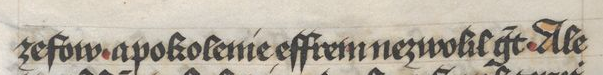zefow.a pokolenie effrem nezwolil ḡt.Ale
